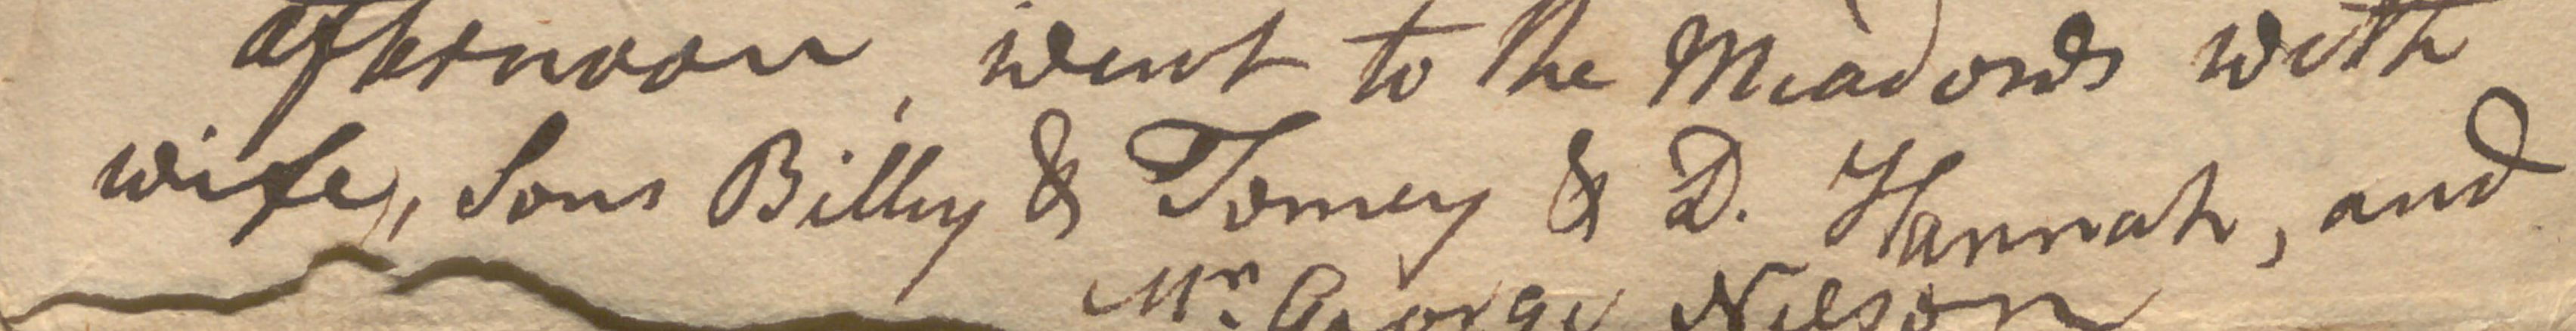wife, sons Billey & Tomey & D. Hannah, and
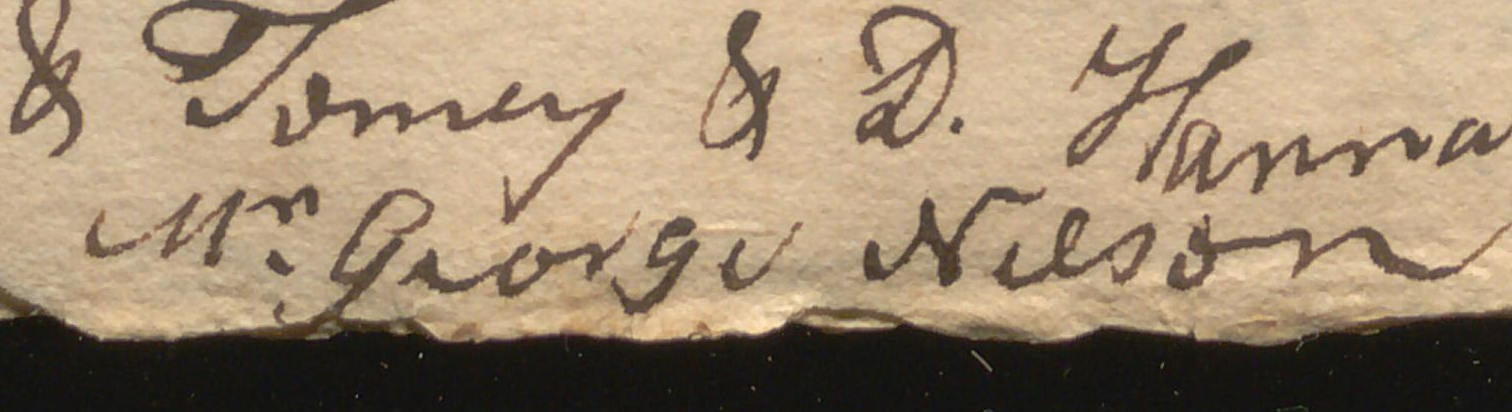M^r. George Nelson
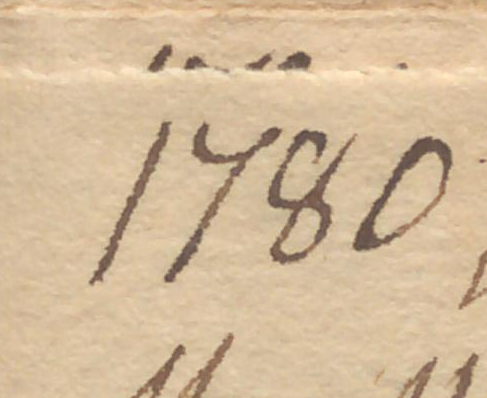1780
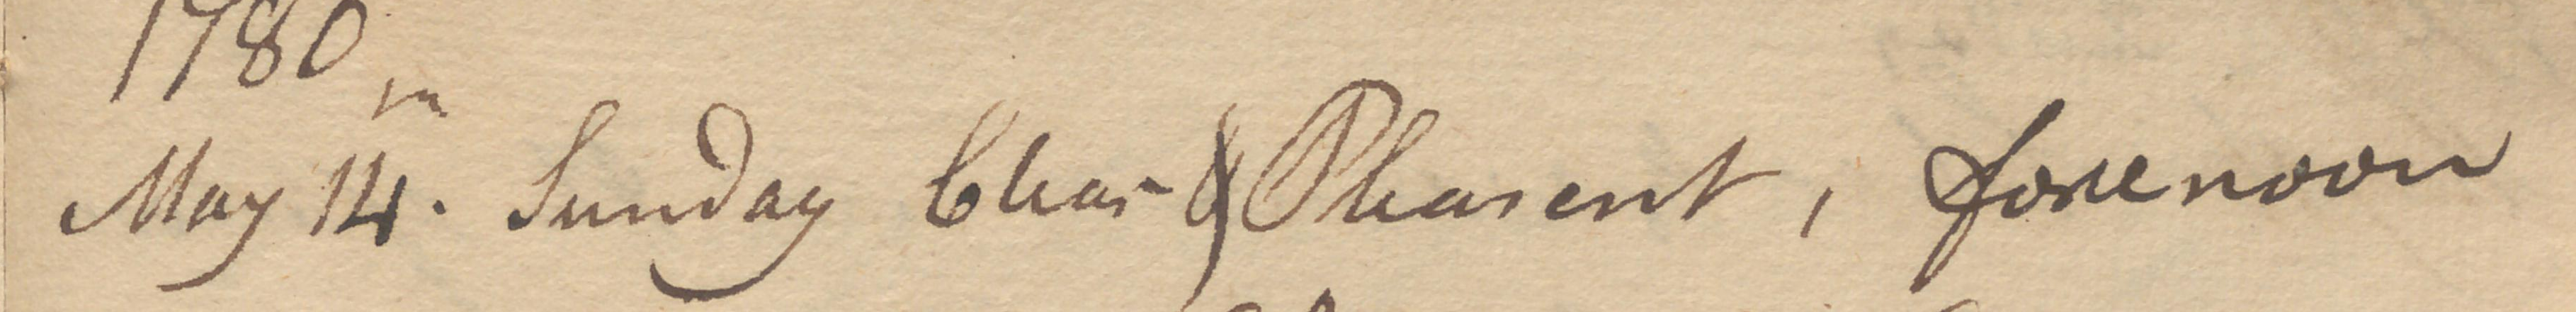May 14^th. Sunday Clear & Pleasent, forenoon
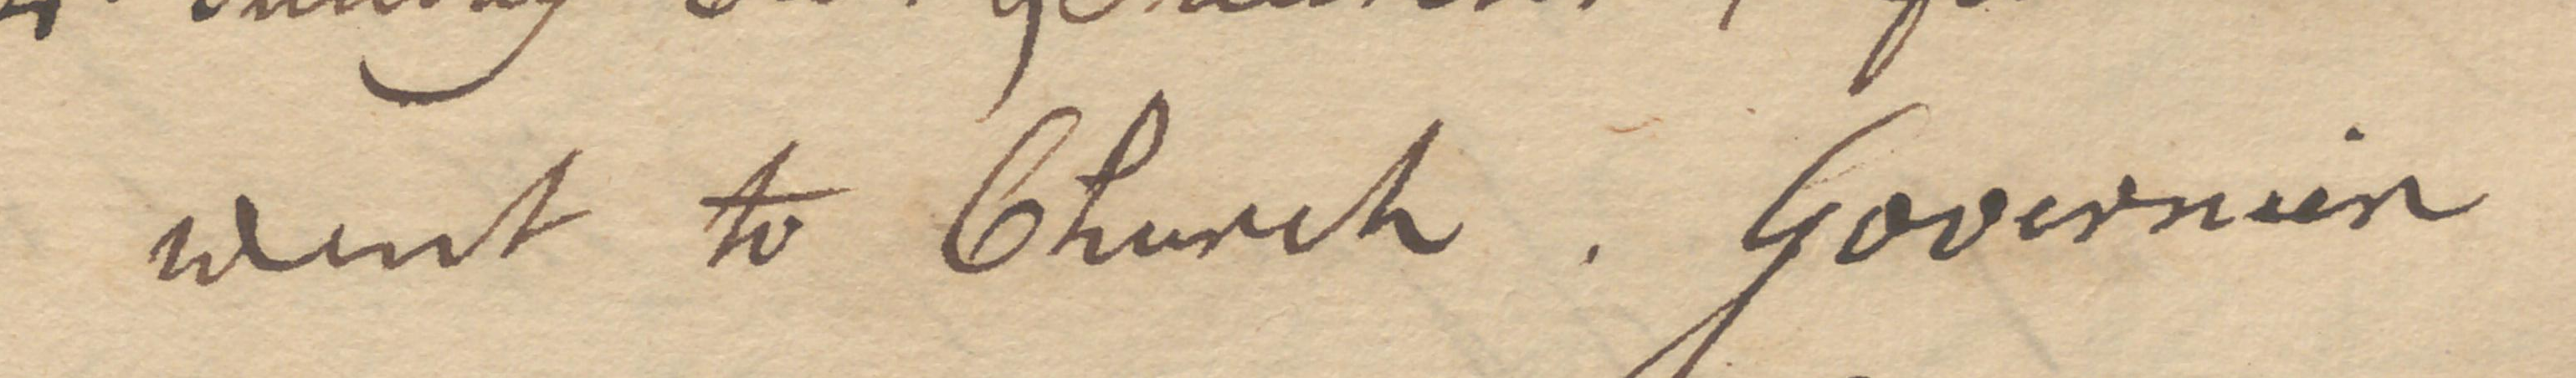went to Church, Governier
